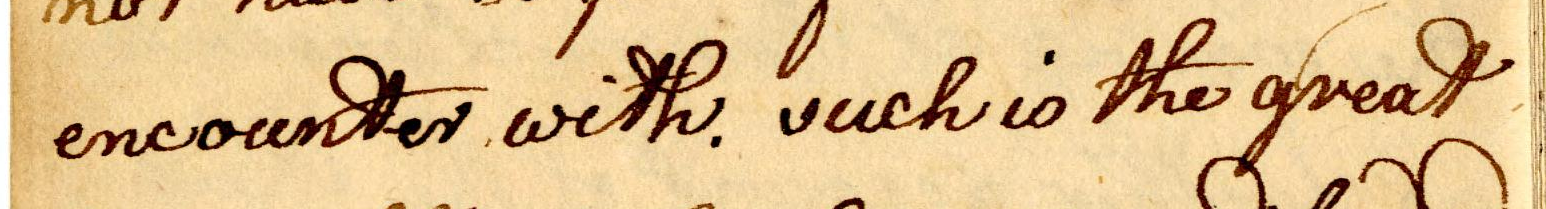encounter with. such is the great
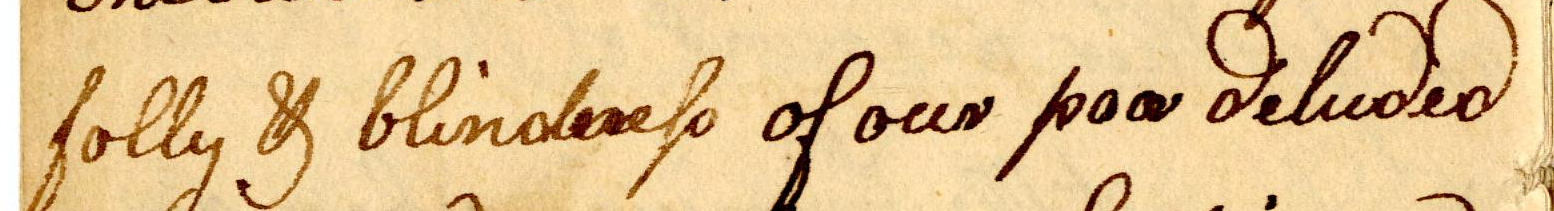folly & blindness of our poor deluded
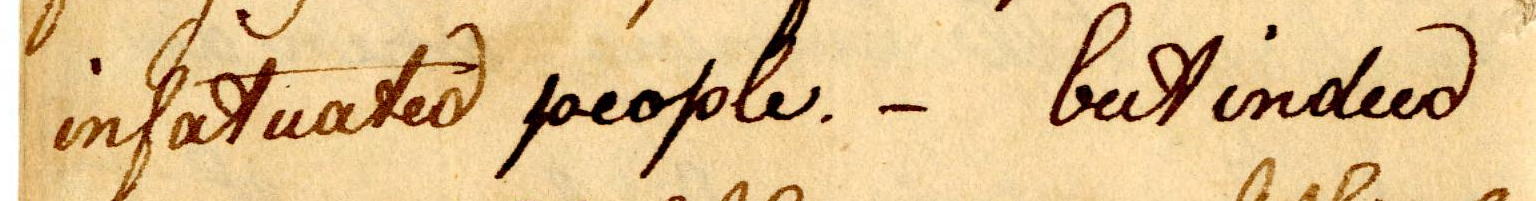infatuated people.- but indeed
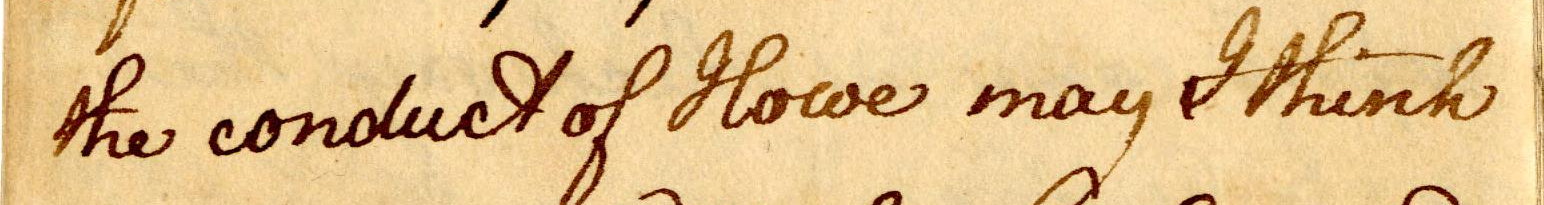the conduct of Howe may I think
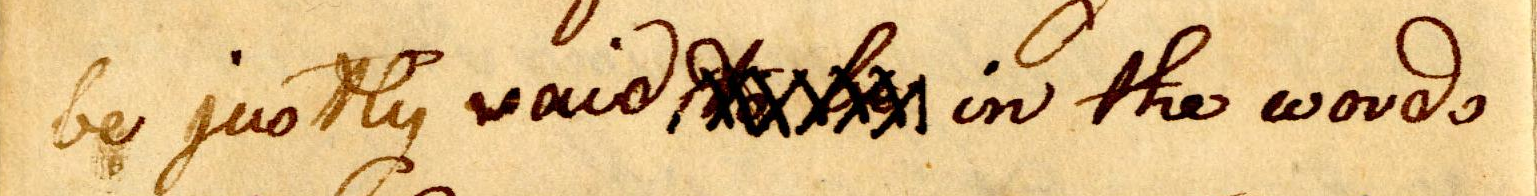be justly said [____] in the words
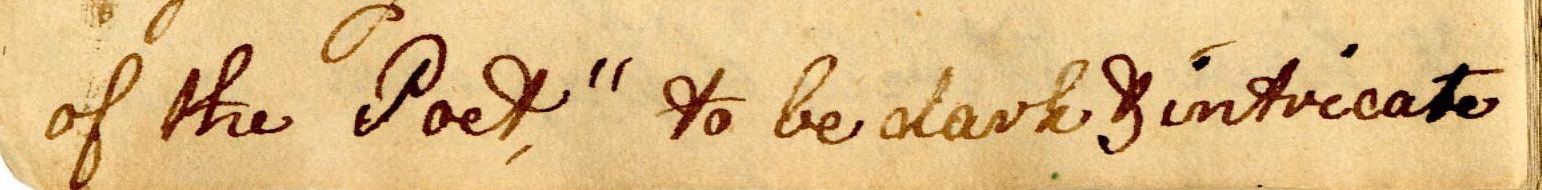of the Poet, "to be dark & intricate
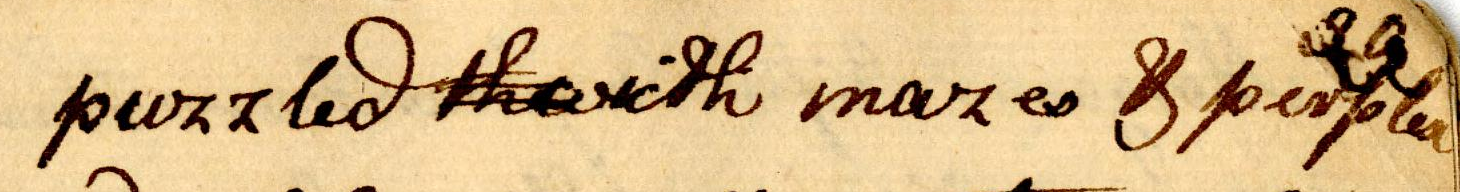puzzled [th] with mazes & perplex
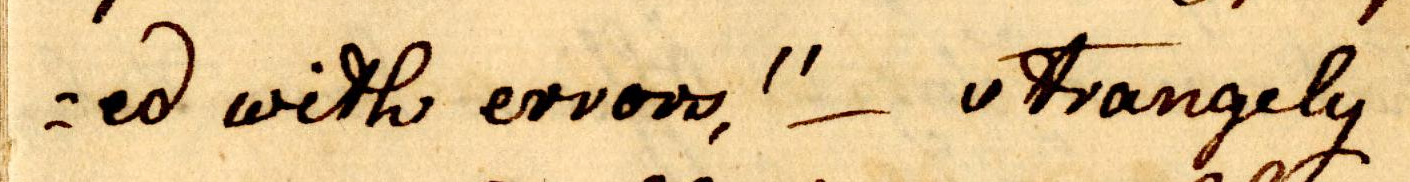-ed with errors,"- strangely
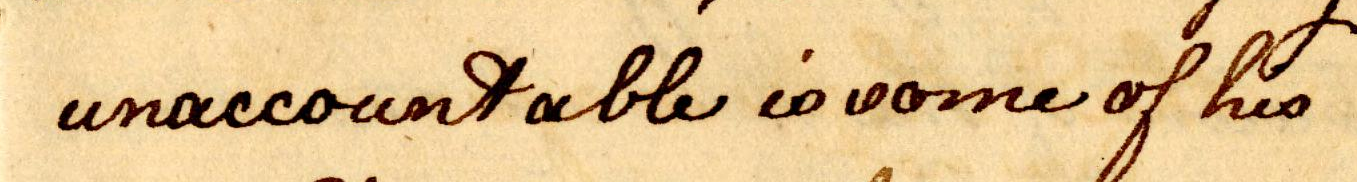unaccountable is some of his
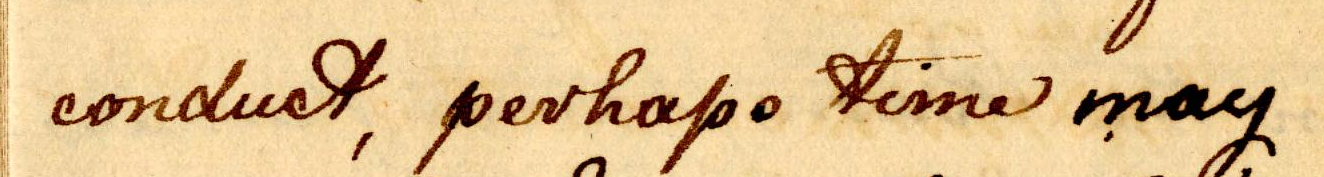conduct, perhaps time may
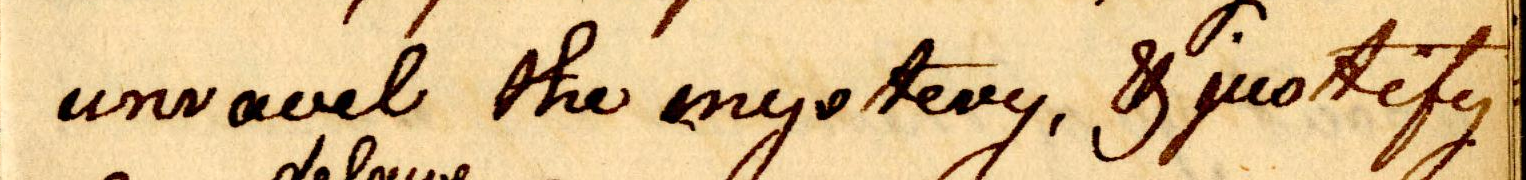unravel the mystery, & justify
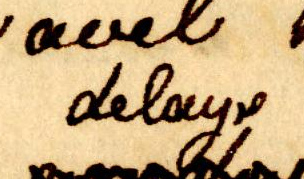delays
